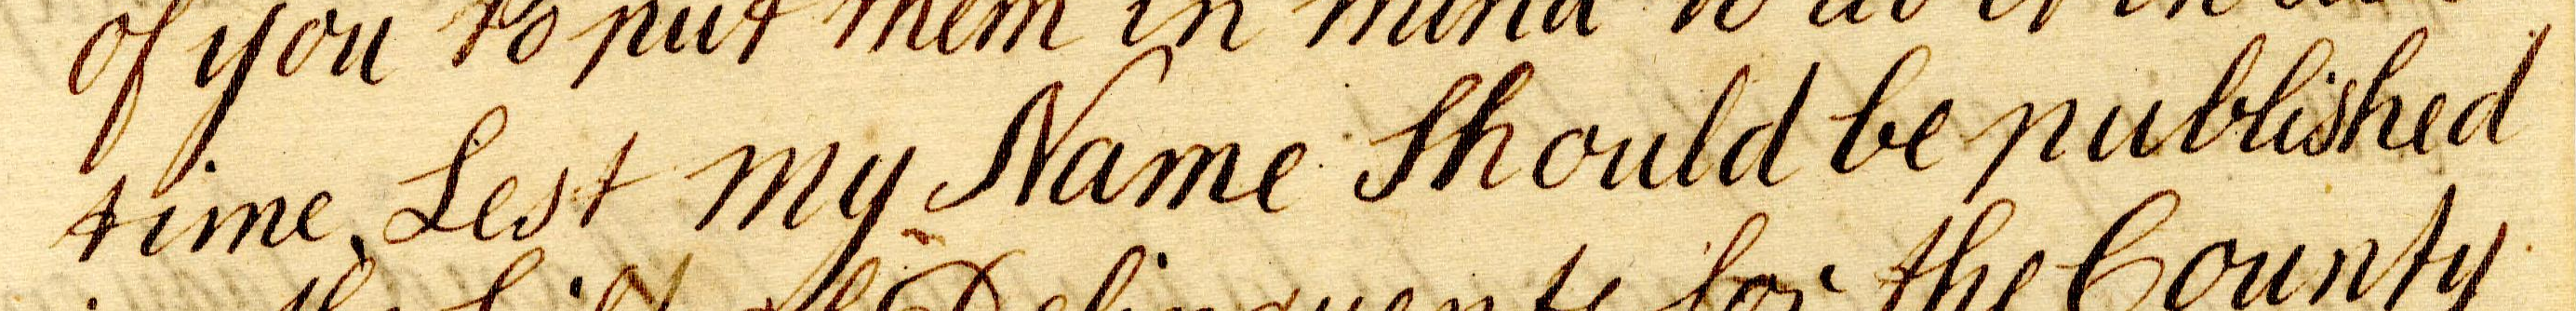time, Lest my Name should be published
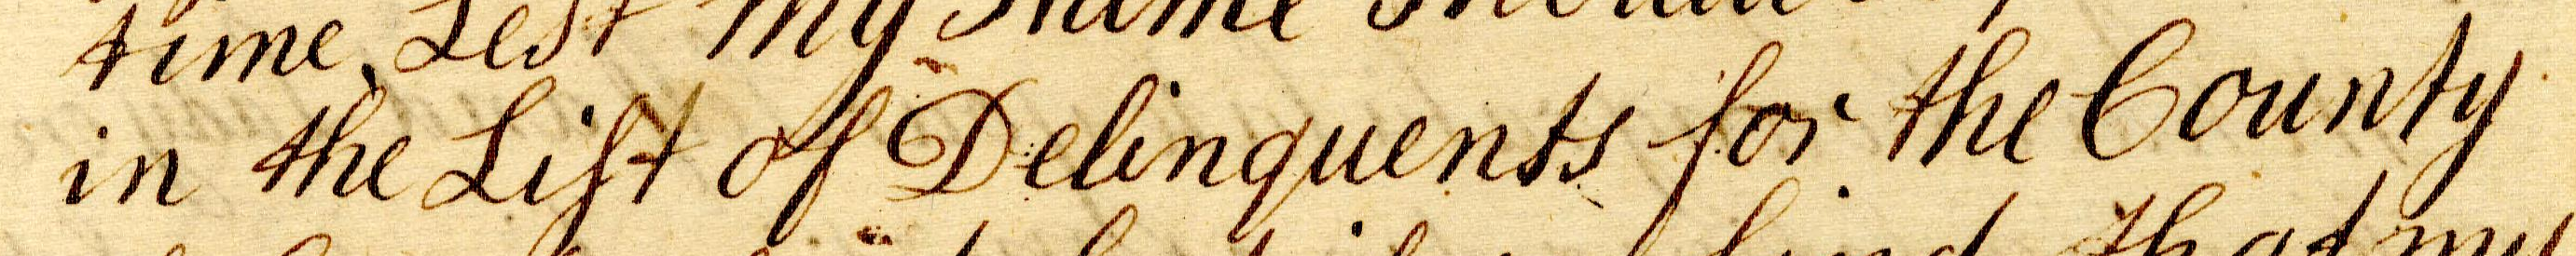in the List of Delinquents for the County
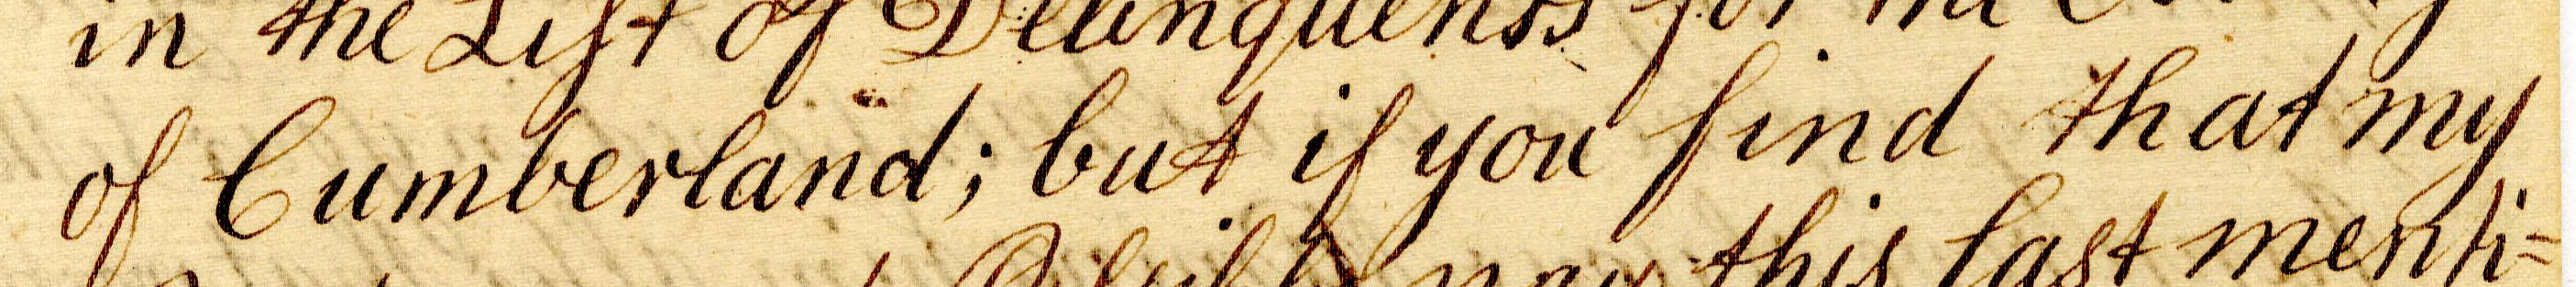of Cumberland; but if you find that my
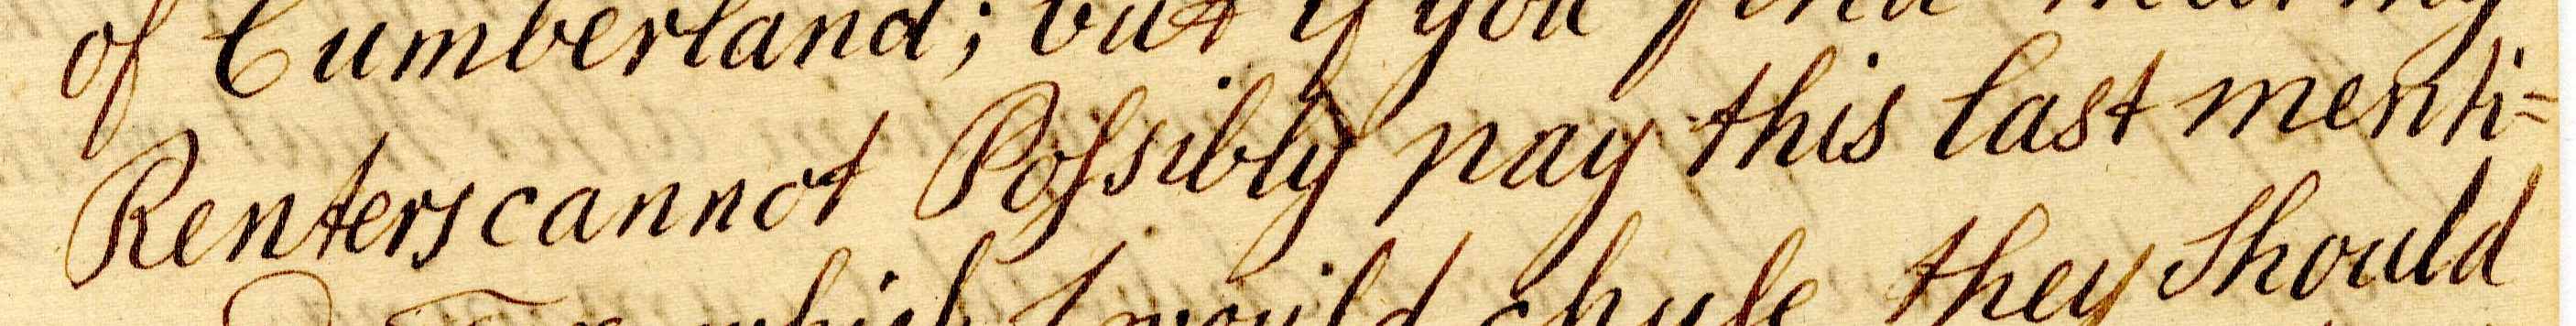Renters cannot Possibly pay this last menti-
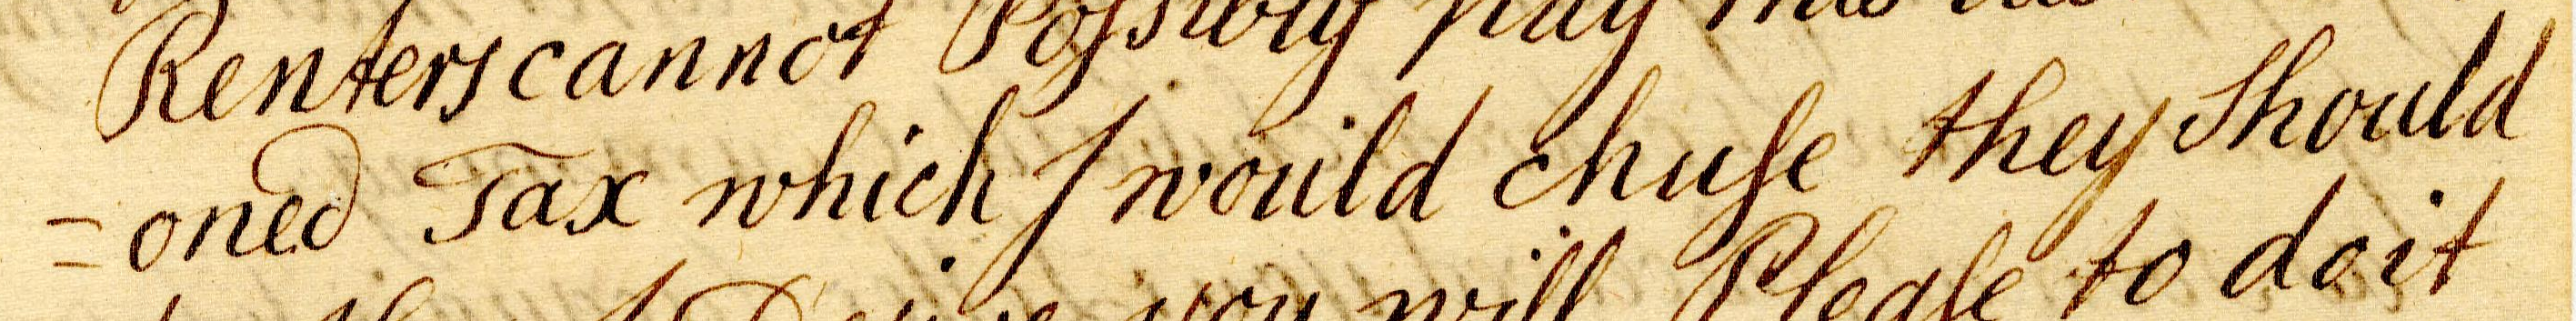-oned Tax which I would chuse they should
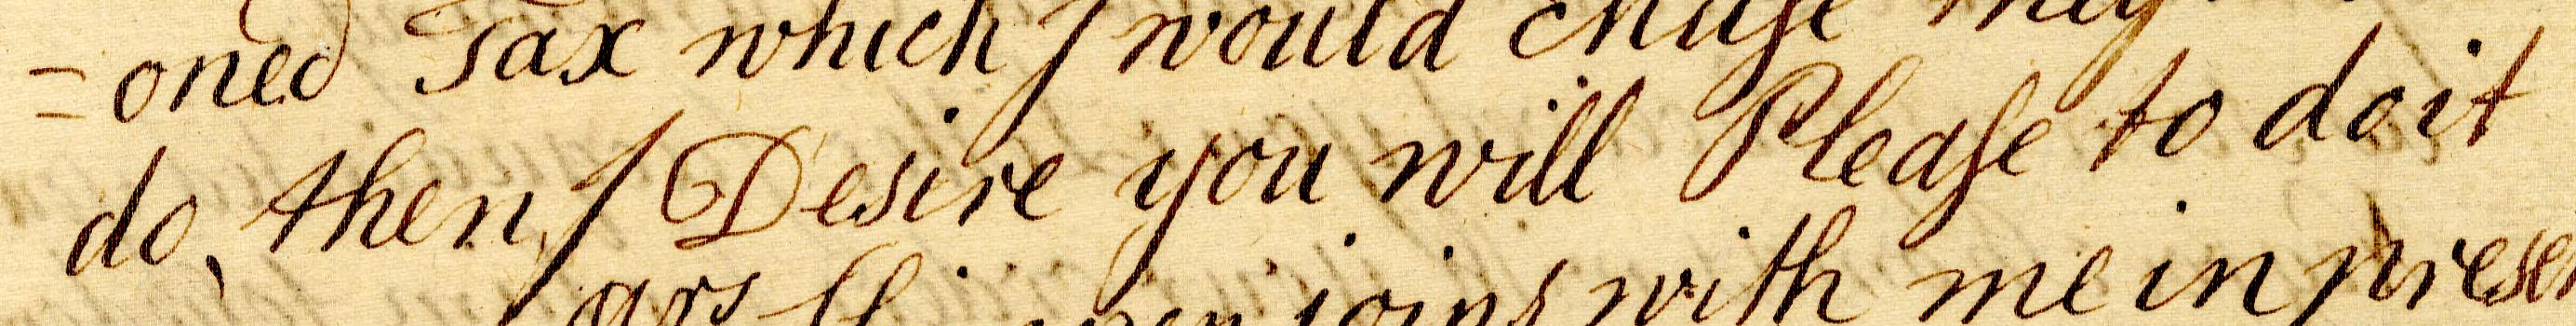do, then I Desire you will Please to do it
